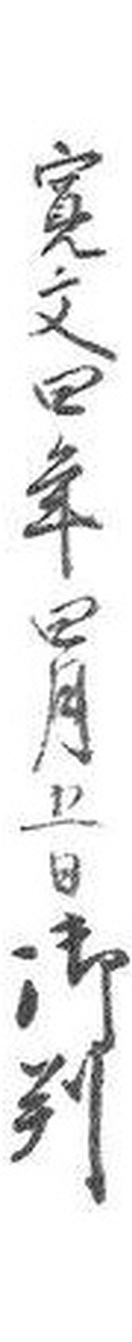寛文四年四月五日御判
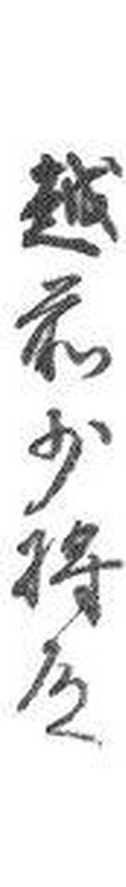越前少将殿
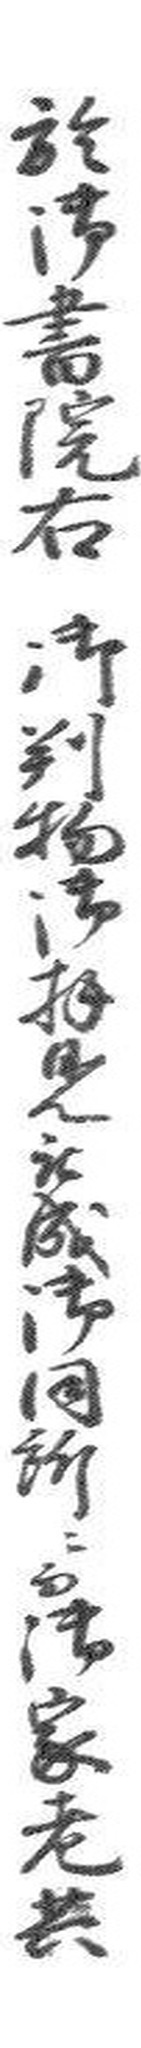於御書院右御判物御拝見被成御同所ニ而御家老共
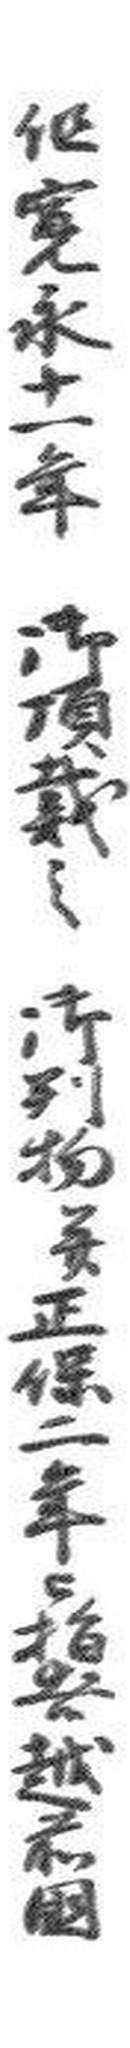但寛永十一年御頂戴之御判物并正保二年被指出候越前国
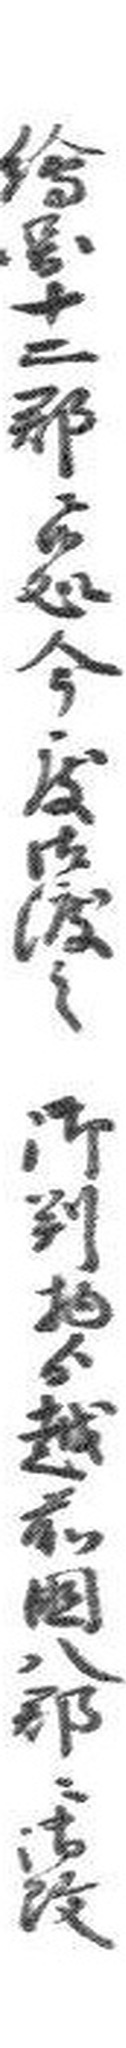絵図十二郡ニ候処今度御渡之御判物ゟ越前国八郡ニ御改
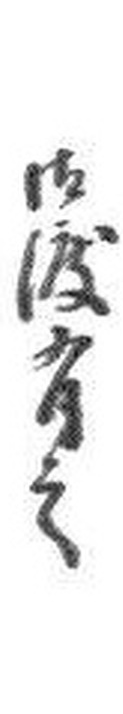御渡有之
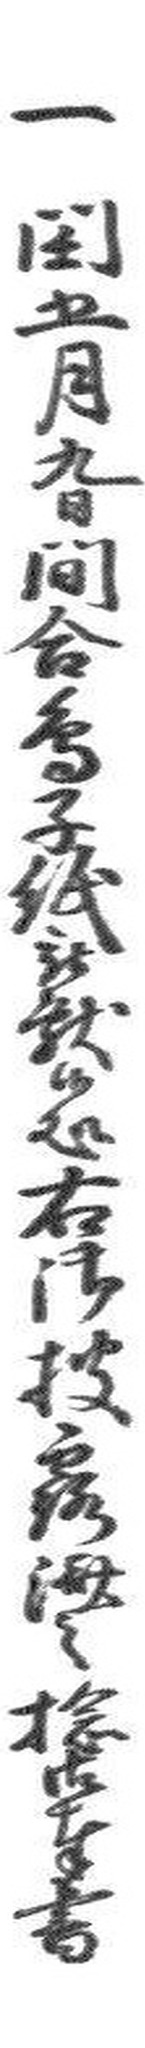一閏五月九日間合鳥子紙被献候処右御披露済之捻御奉書

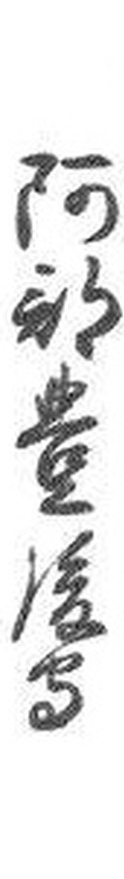阿部豊後守
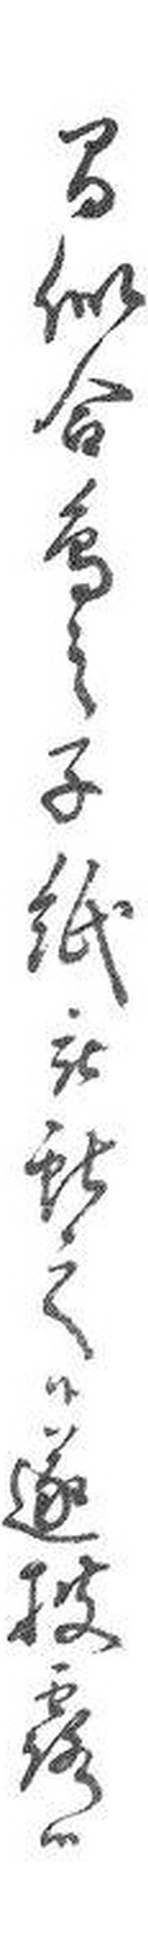間似合鳥之子紙被献之候遂披露候
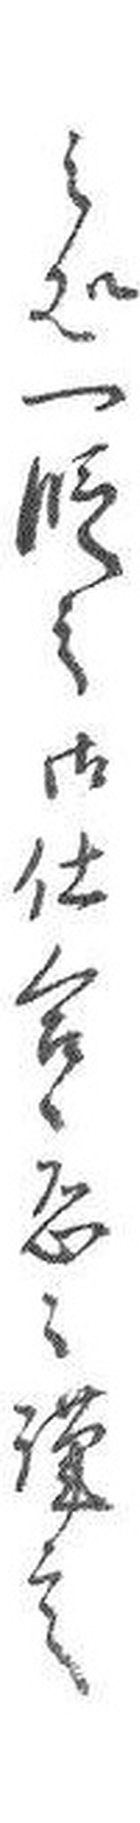之処一段之御仕合候恐々謹言
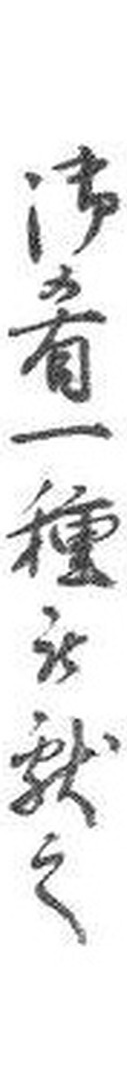御肴一種被献之
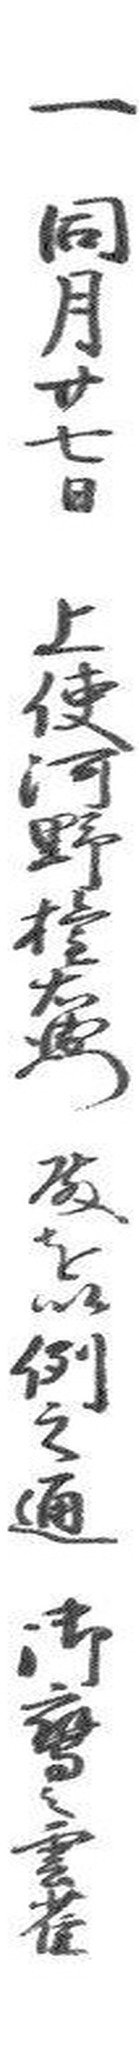一同月廿七日上使河野権左衛門殿を以例之通御鷹之雲雀
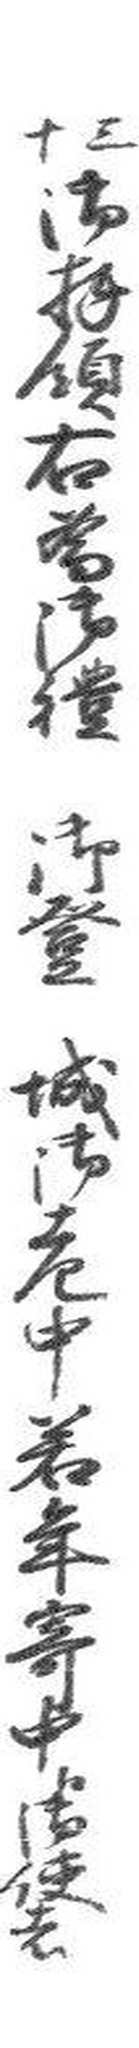三十御拝領右為御礼御登城御老中若年寄中江御使者
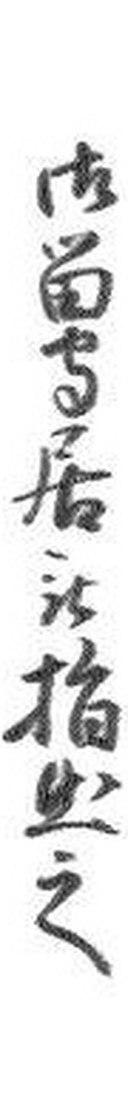御留守居被指出之
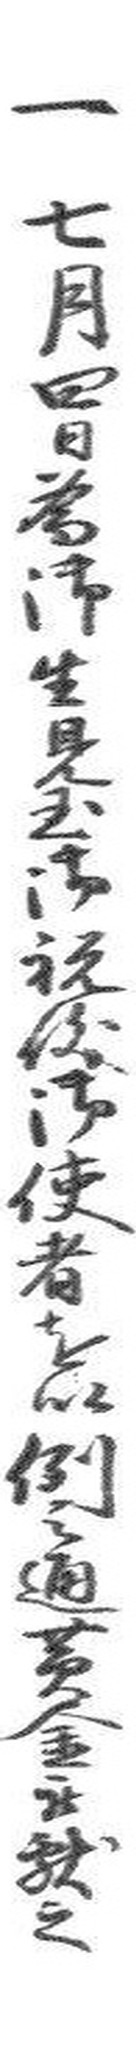一七月四日為御生御生見玉御祝儀御使者を以例之通黄金被献之
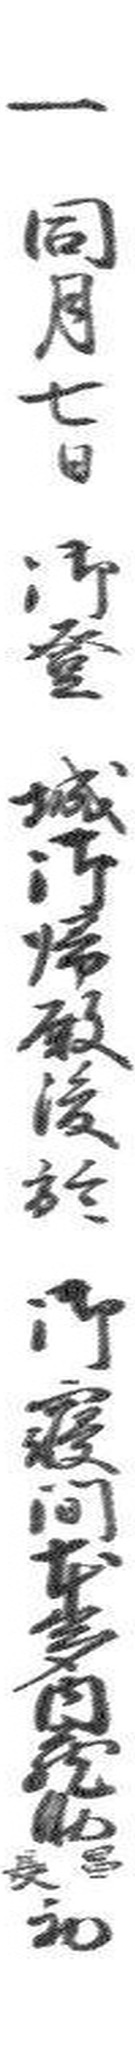一同月七日御登城御帰殿後於御寝間本多内蔵助昌長初
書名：家譜 七 光通公 従寛文四年到同九年
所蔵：福井県文書館 Fukui Prefectural Archives
